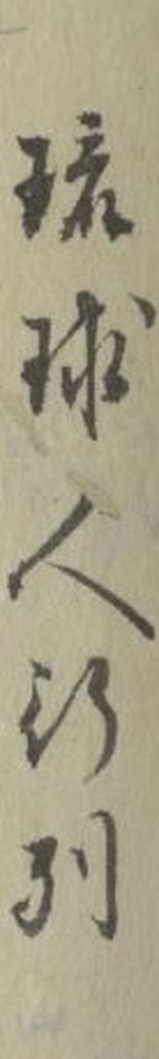琉球人行列

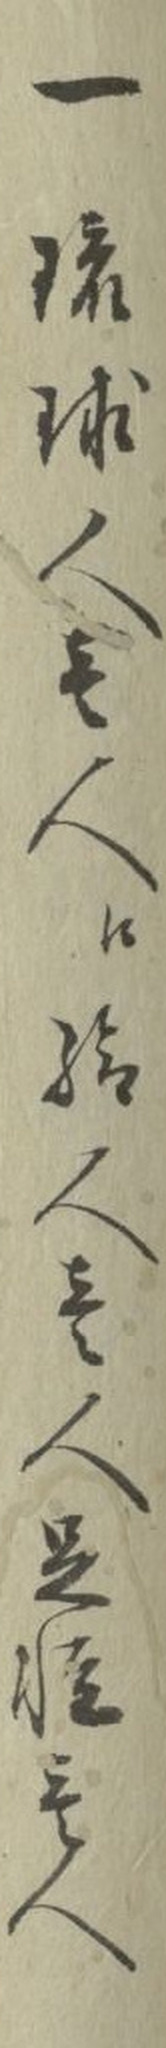一琉球人壱人え給人壱人足軽壱人
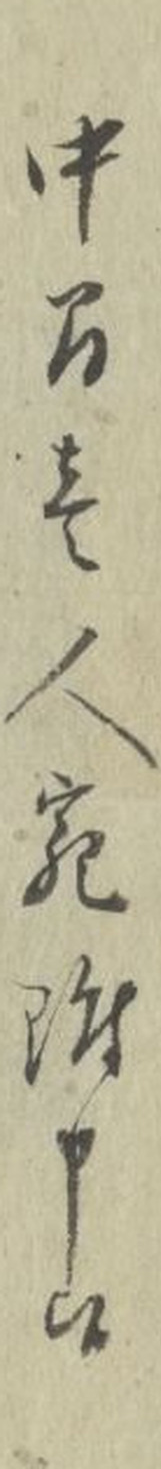中間壱人宛附申候
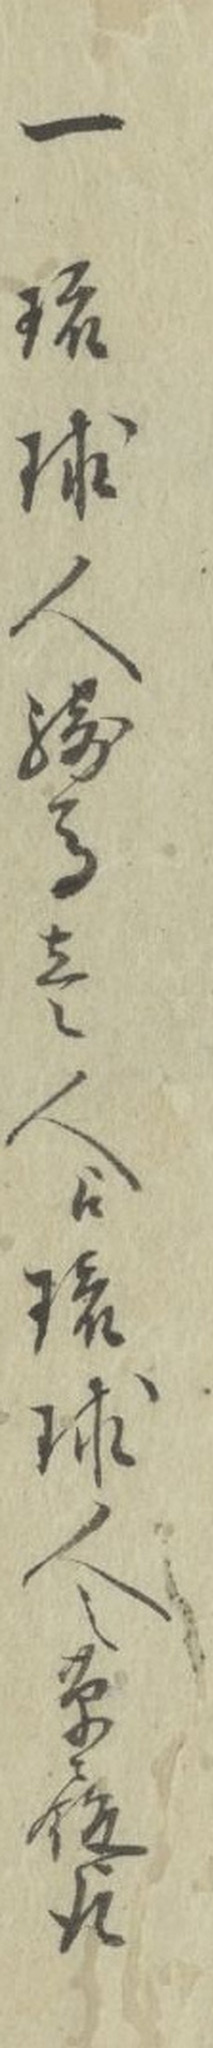一琉球人騎馬壱人え琉球人之草履取
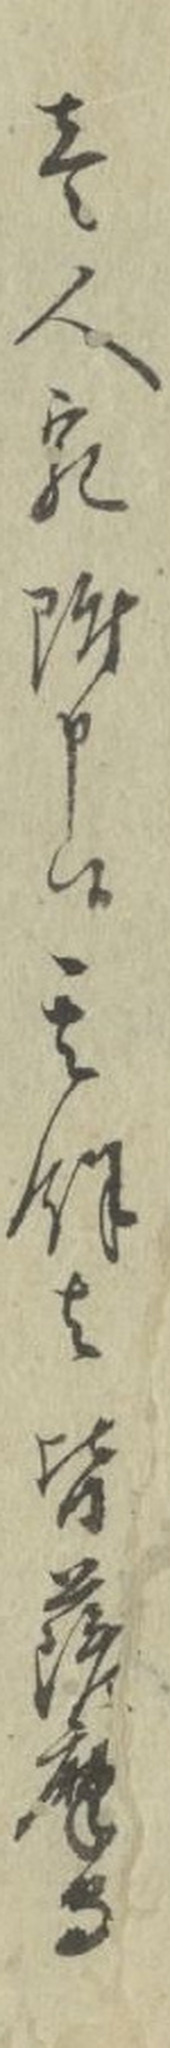壱人宛附申候其余は皆薩摩守
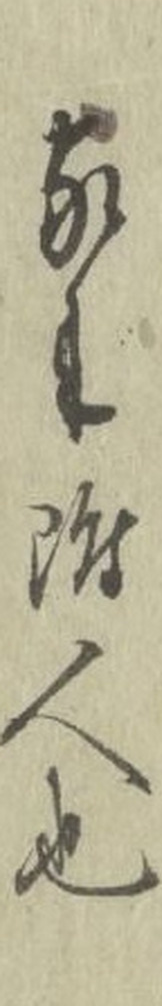家来附人也

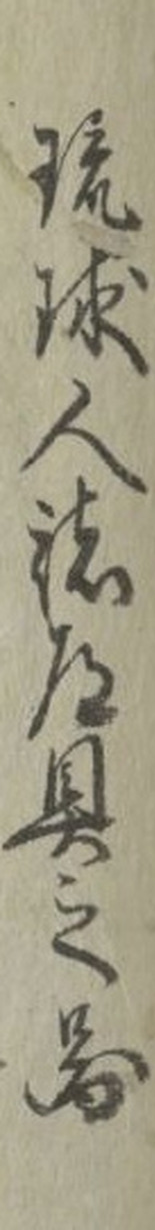琉球人諸道具之図

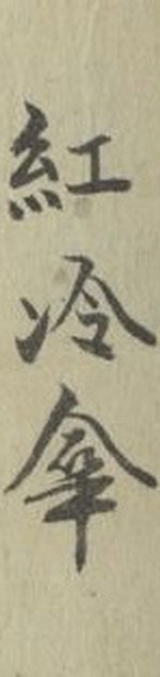紅冷傘

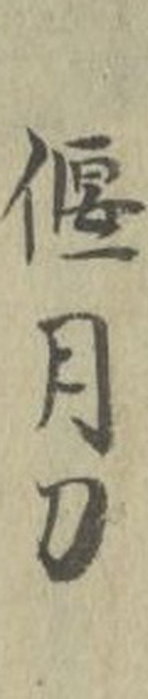偃月刀

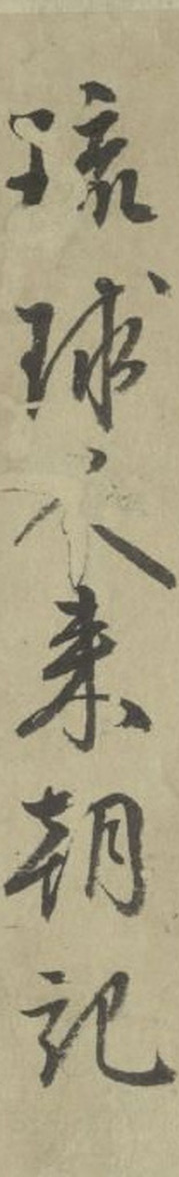琉球人来朝記

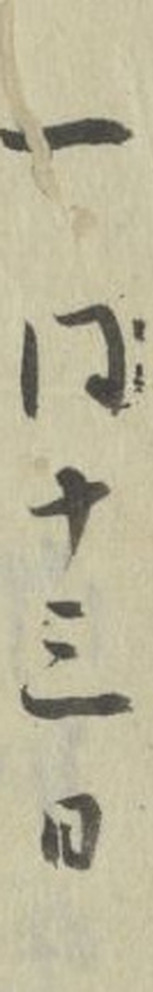一同十三日
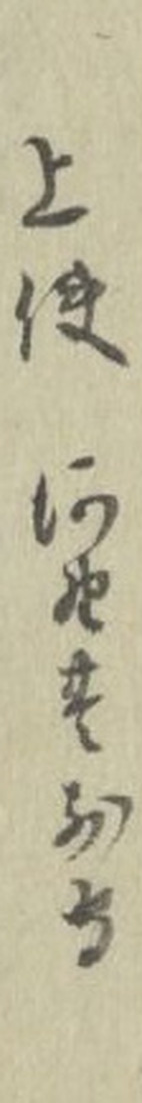上使河野豊前守
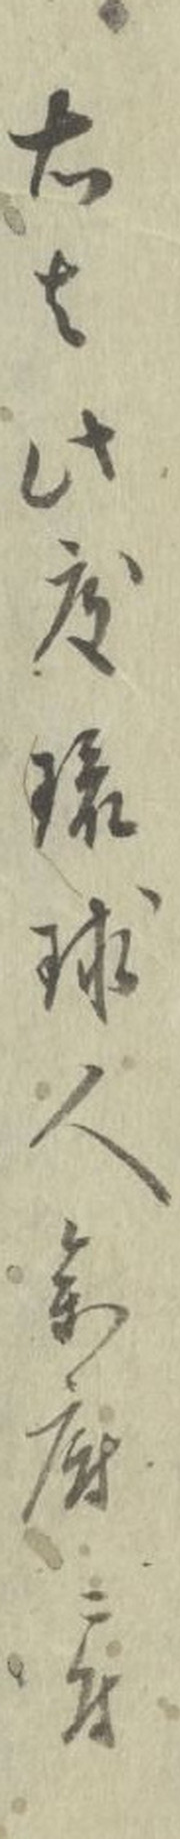右は此度琉球人参府に付
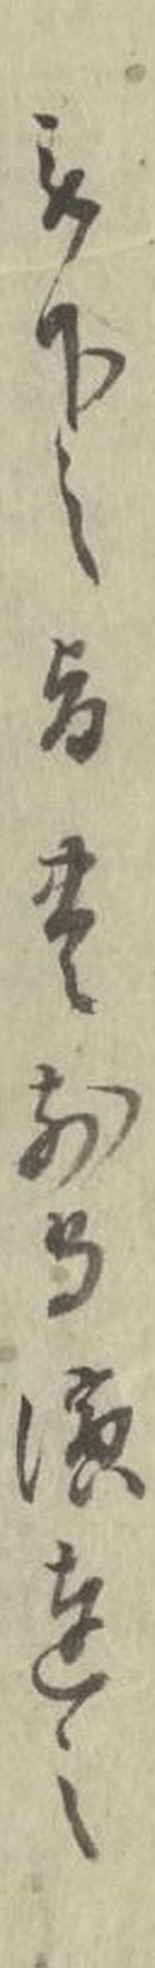被下之旨豊前守演達之

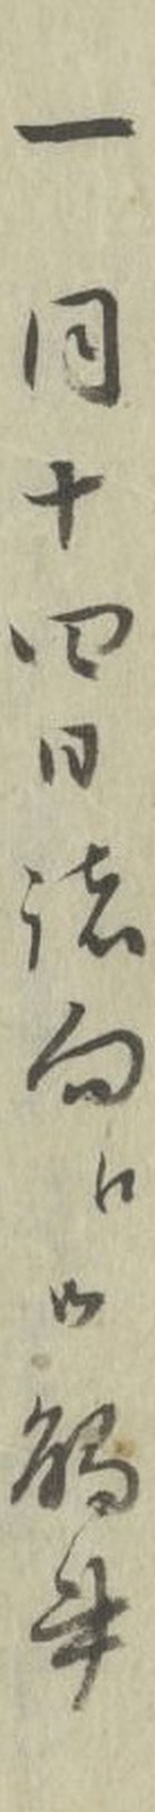一同十四日諸向え御触書
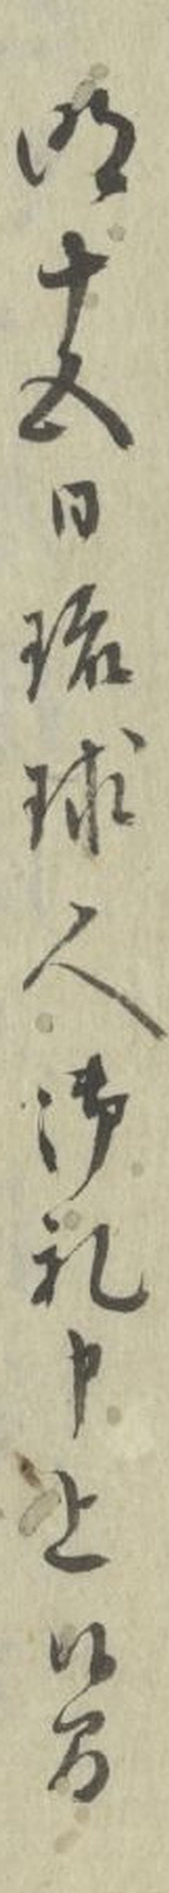明十五日琉球人御礼申上候間
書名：琉球来朝記 自一至七
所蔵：University of the Ryukyus Library
